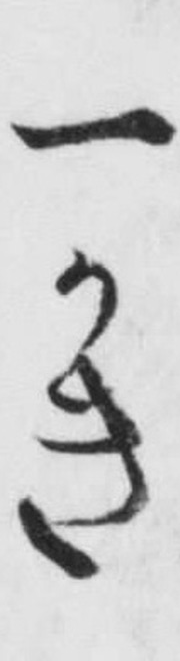一かき
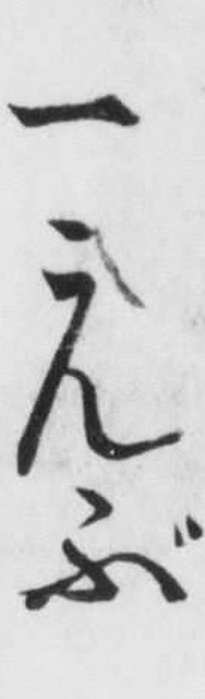一こんぶ
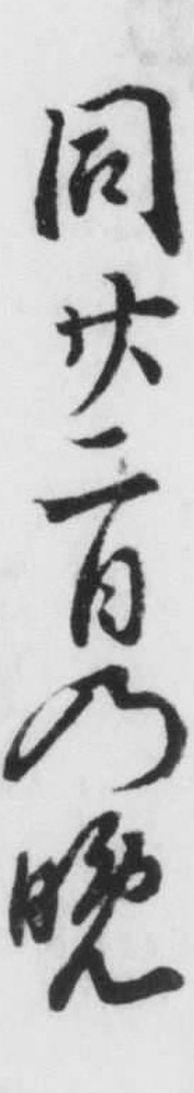同廿二日乃
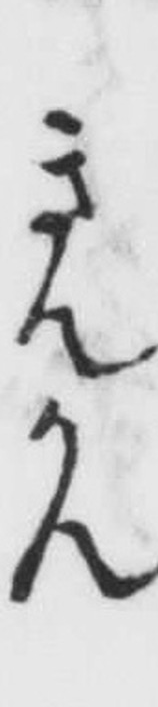きんかん
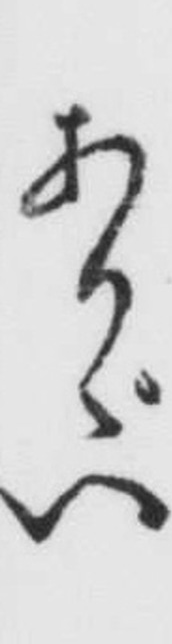あかゞい
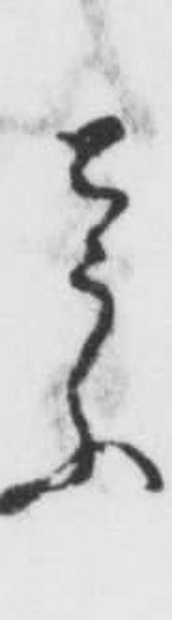とうふ
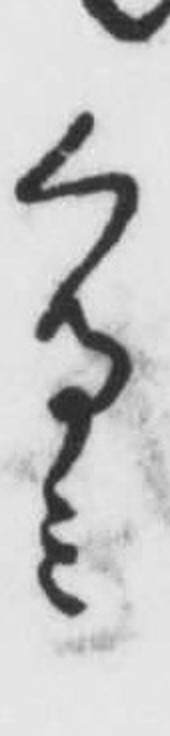くるミ
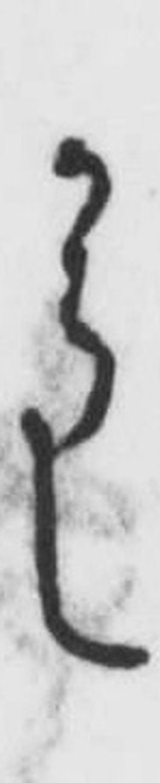からし
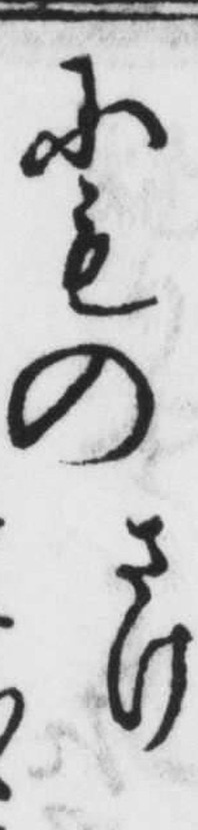小ものさけ
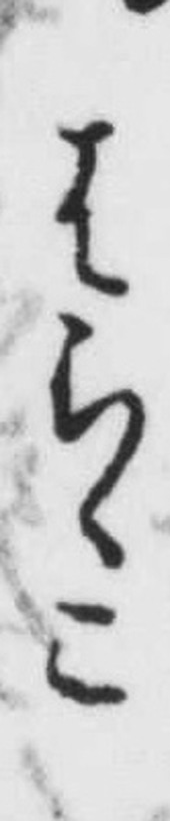はらゝこ
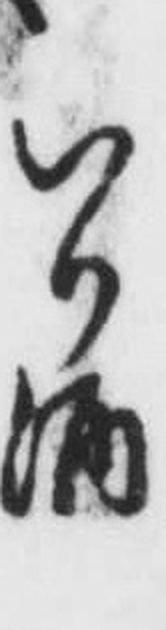いり酒
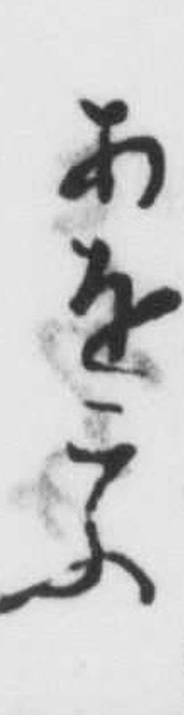あをこふ
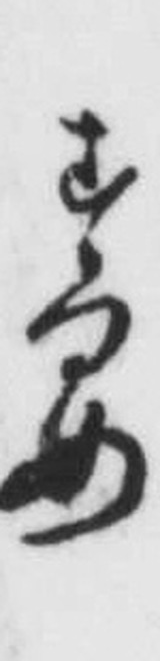するめ
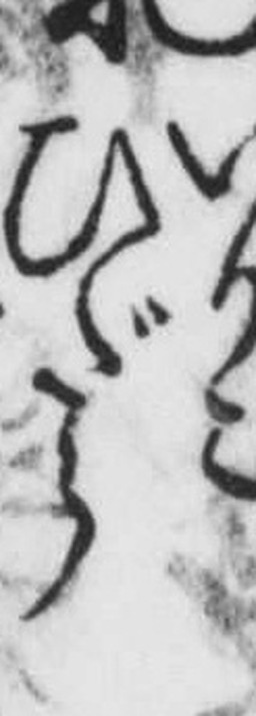ひだら
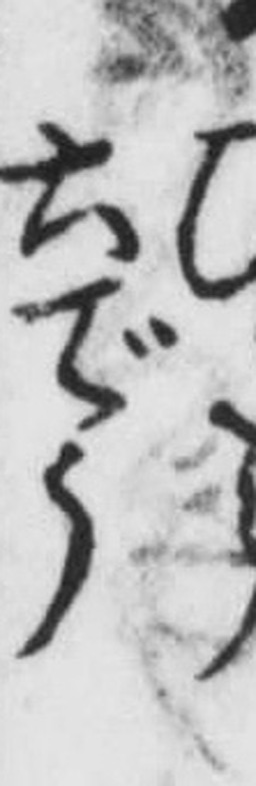六でう

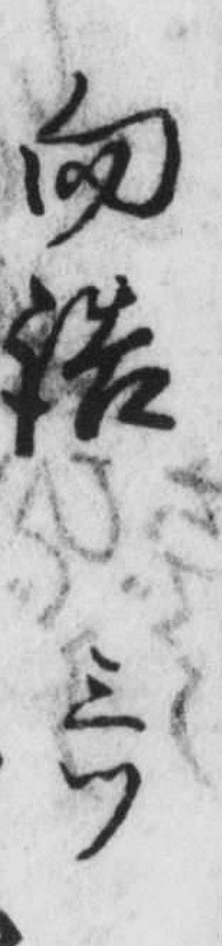向詰三ツ
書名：料理切形秘伝抄
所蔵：大阪府立大学学術情報センター 国文学研究資料館
